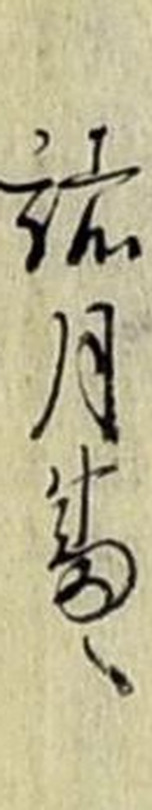諸月番へ
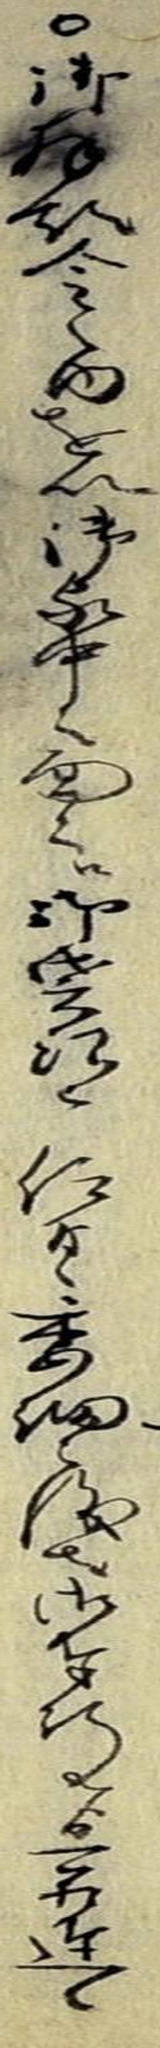〇御拝領金之内を以御家中之面々え御貸銀被仰付候委細之儀は御奉行共ゟ可相達候
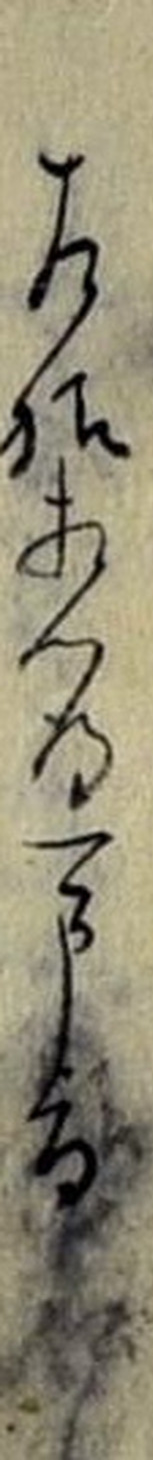左様相心得可申旨
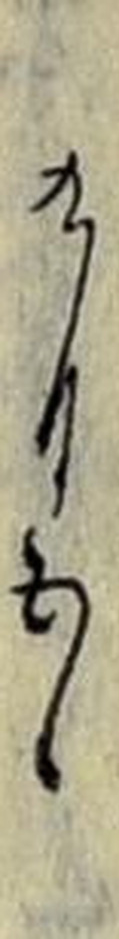九月五日
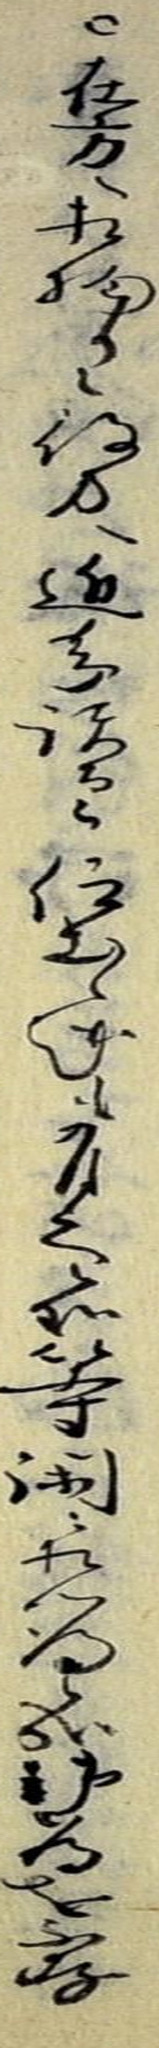〇在方へ相拘り候役方へ近年訳而被仰出候趣も有之候処等閑に相心得候哉御為を不存
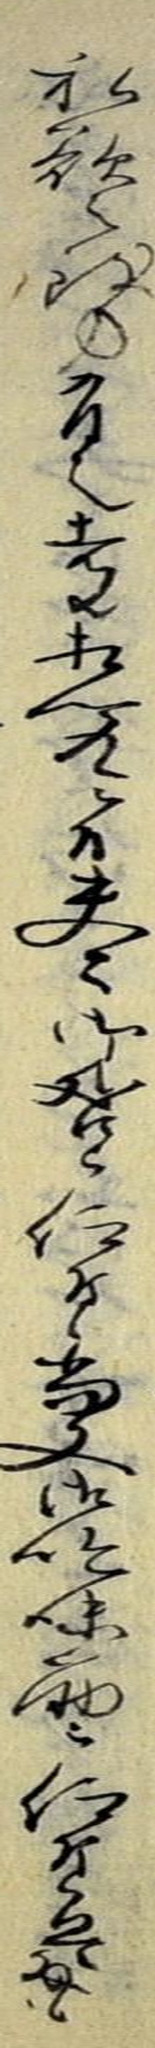私欲之致方有之者共相聞候に付夫々御咎被仰付候尚又御吟味筋被仰付置候義も
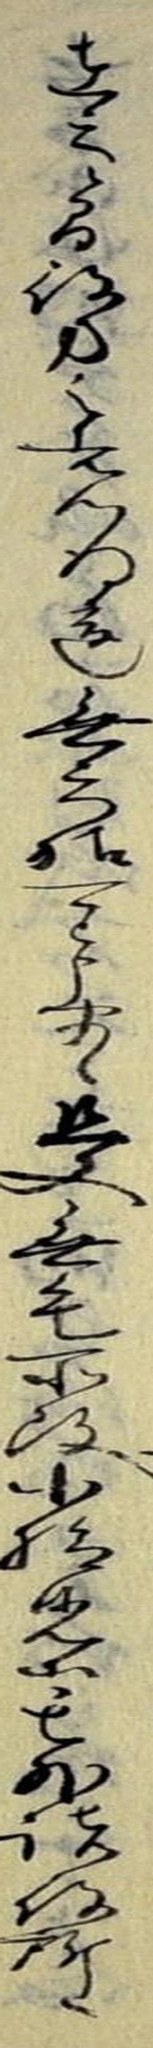在之候間役方之者心得違無之様可被申聞候且又無毛所改小検見等其外諸役所へ
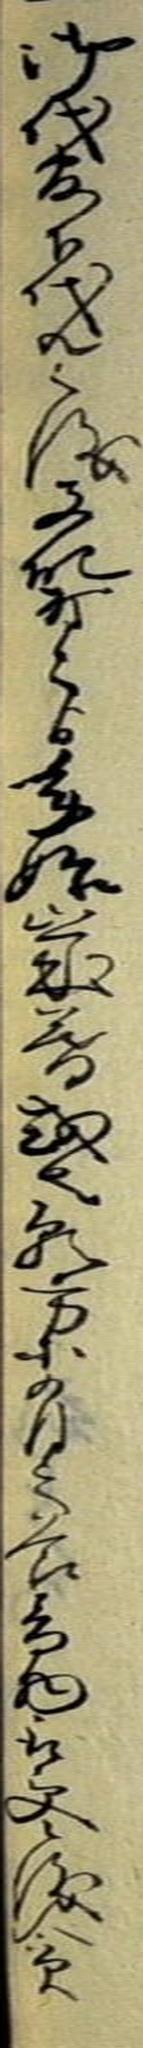一御官下代共之儀支配村々ゟ年始歳暮或は願方等有之節音物取受候儀貪
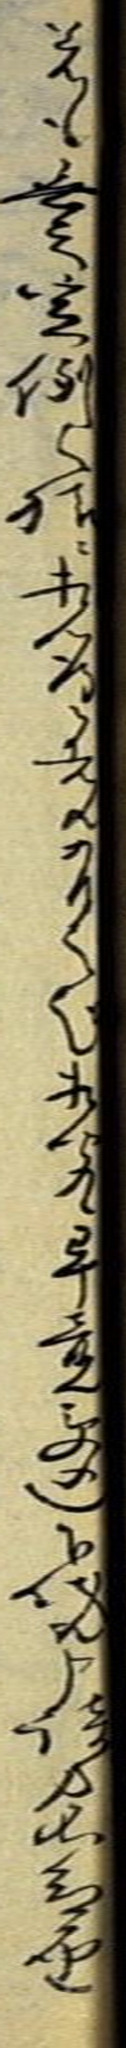着も無之定例之様に相心得之者共有之趣相聞候畢竟受込下代共申談方不参届
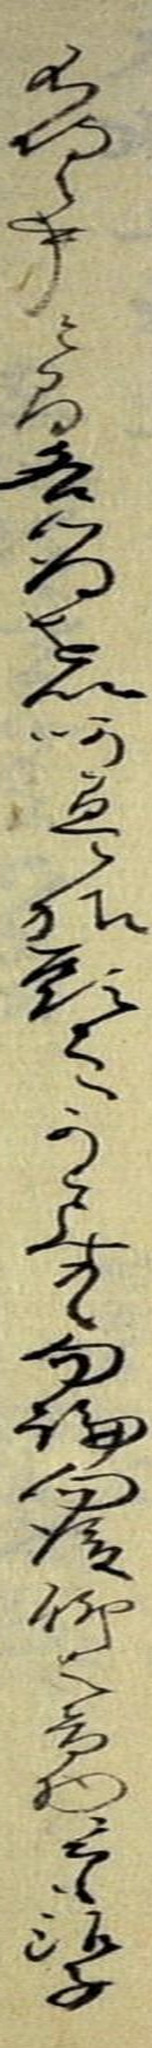不埒之事に候間各心得を以呵置候様頭々へ可被申聞候勿論向後聊之音物に而も銀子
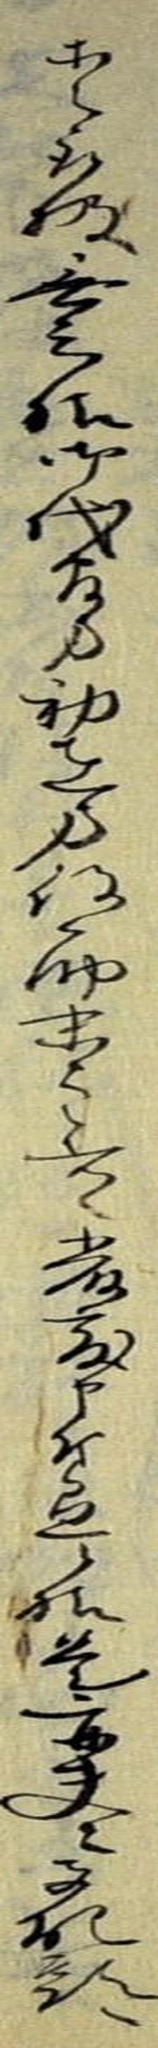等之取扱無之様御代官方初在方役筋末々之者へ厳敷申付置候様是亦夫々支配頭へ
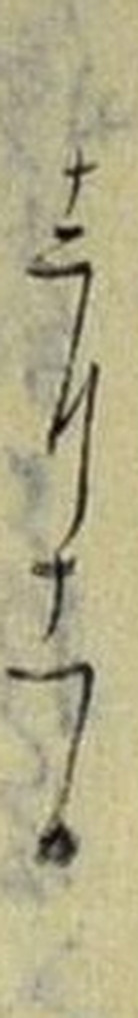十二月十一日
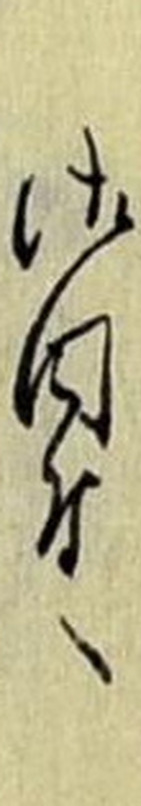御目付へ
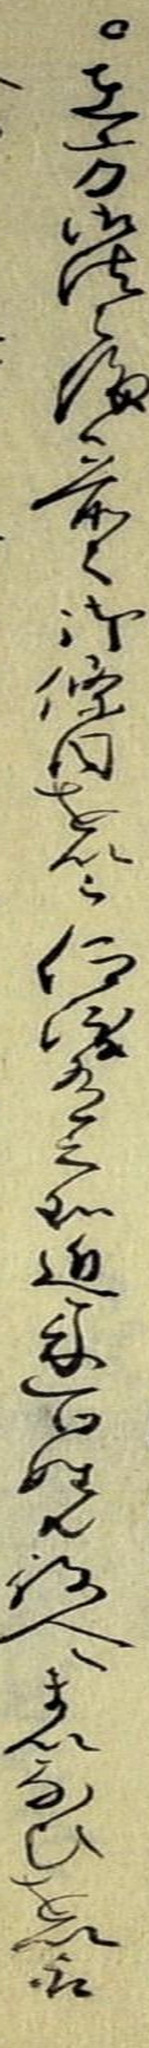〇在方御法之儀は前々御条目を以被仰渡有之処近年百姓共役人へまいなひを以取
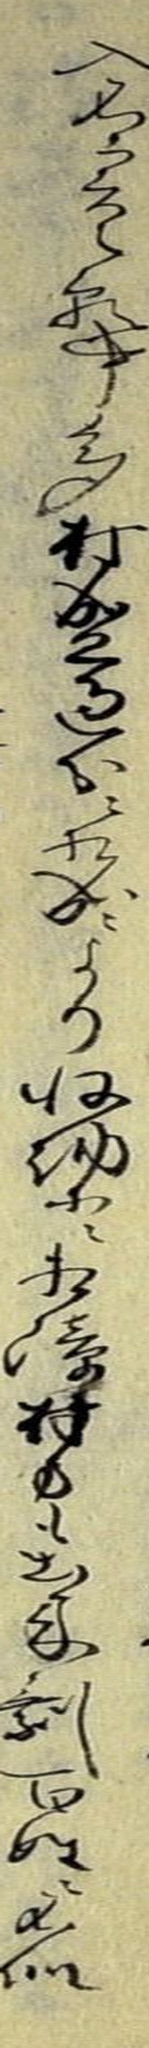入不実之願事多村盛過分に相成により収納等に相障村方も出来剰百姓に不似
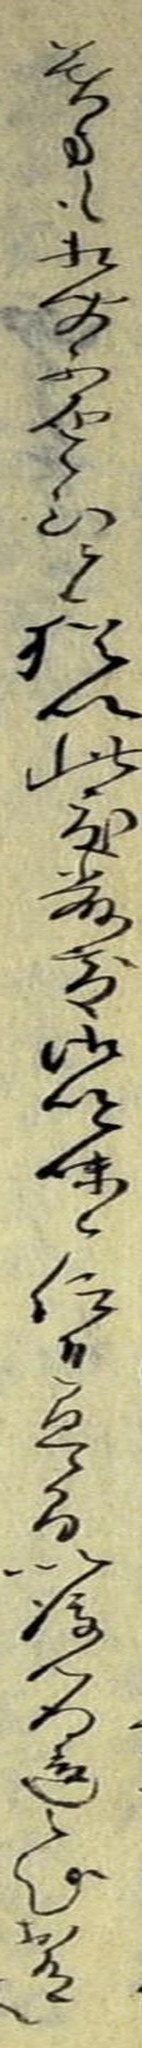暮方も相聞不届之至に候猶以此度厳敷御吟味被仰付置候間以後心得違之趣於有之
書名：命令之部 二
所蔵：福井県文書館 Fukui Prefectural Archives
